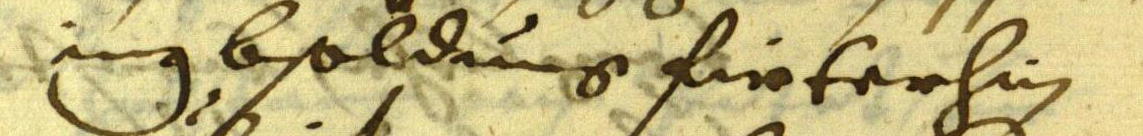ing bsoldūng firterhin
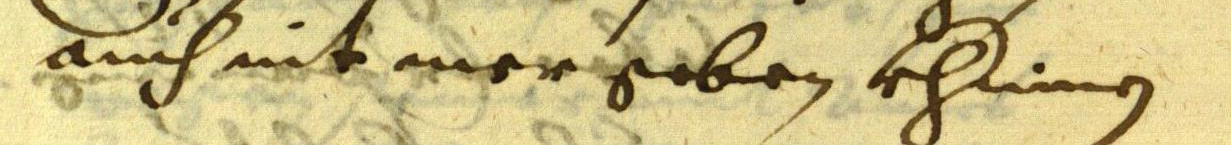aūch nit mer geben khūnen
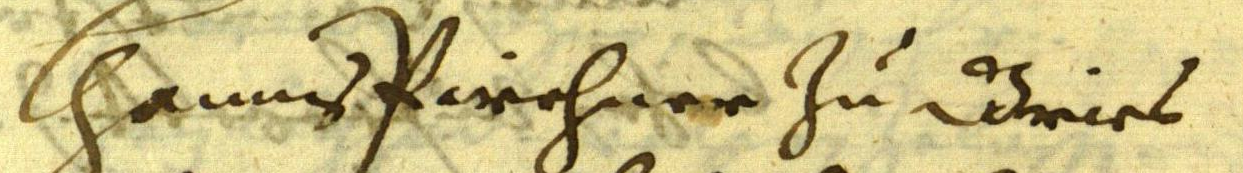Hanns Pirchner Zū Gries
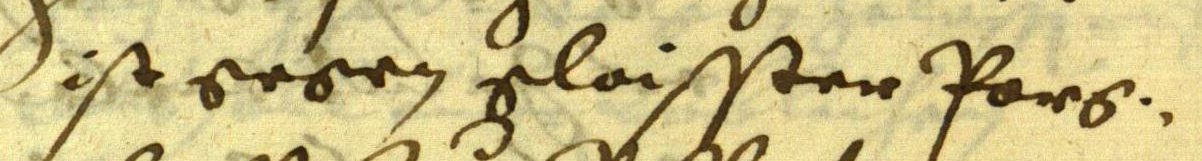ist gegen glaisster Porg¬
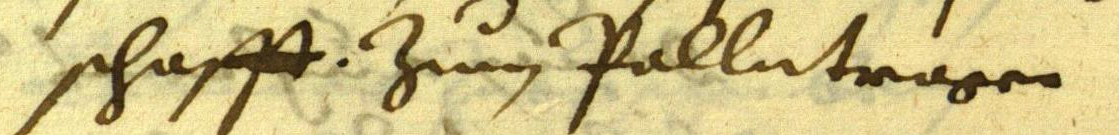schafft. Zūm Pallntrager
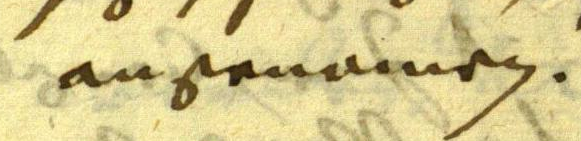angenomen.
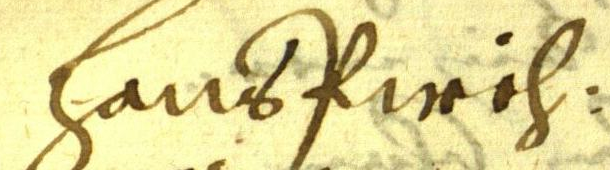Hans Pirch¬
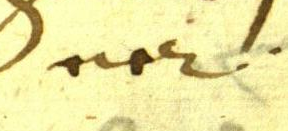ner.
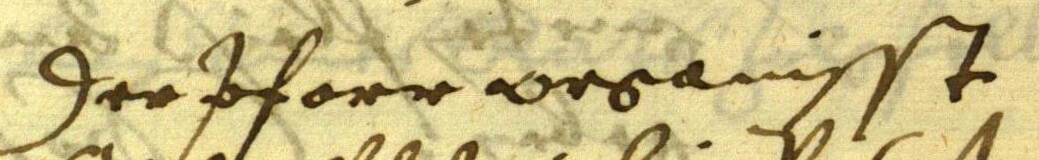Der Pfarr Organisst
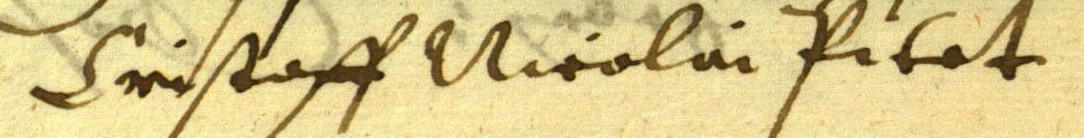Cristoff Nicolai Pitet
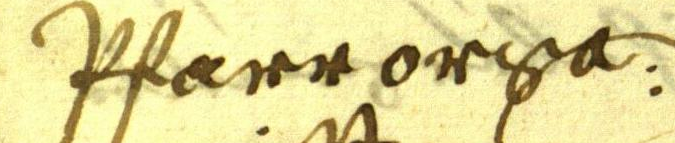Pfarrorga¬
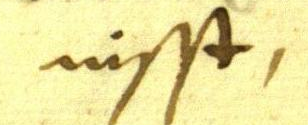nisst,
